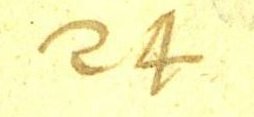24
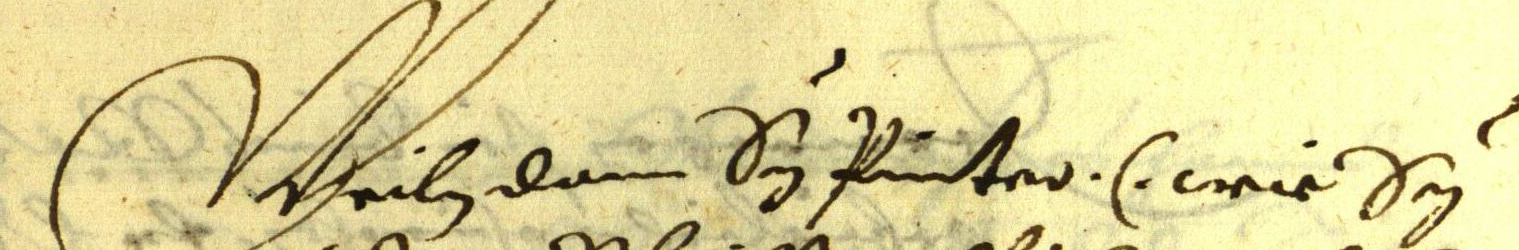Weiln dann Sȳ Pinter .(.wie Sȳ
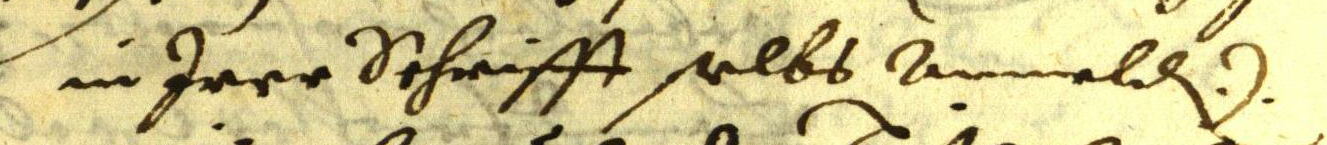In Irer Schrifft selbs Anmeld.).
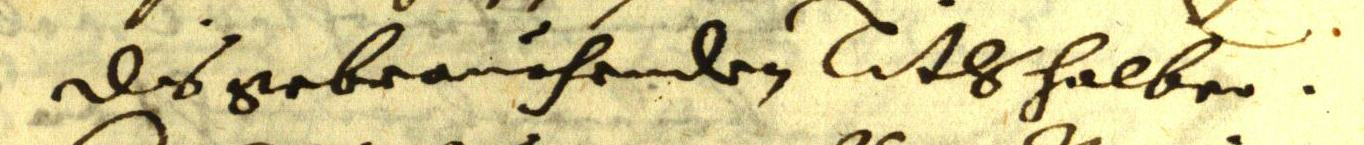dis gebraūchenden Titls halber.
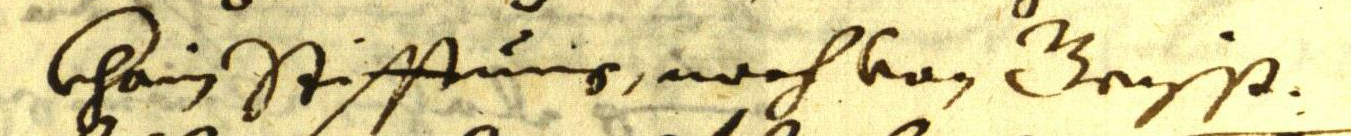Khain Stifftūng, noch von Geisst¬
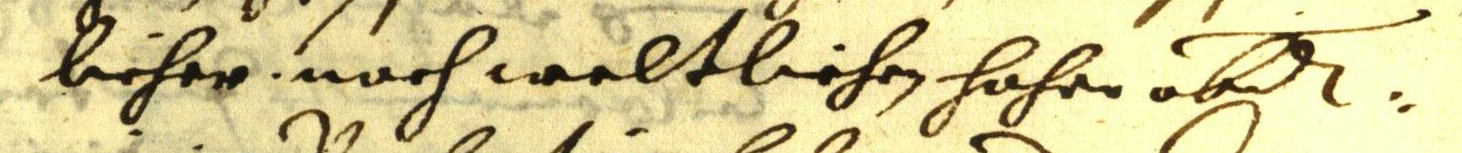licher. noch weltlichen hohen ob
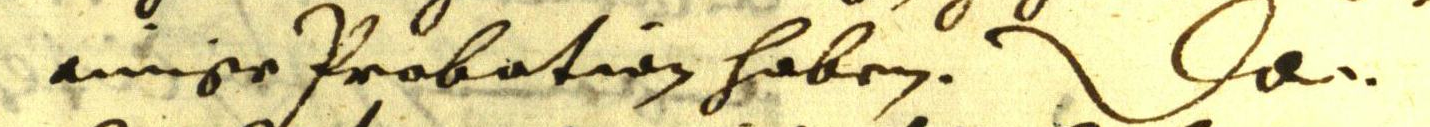ainige Probation haben. Da¬
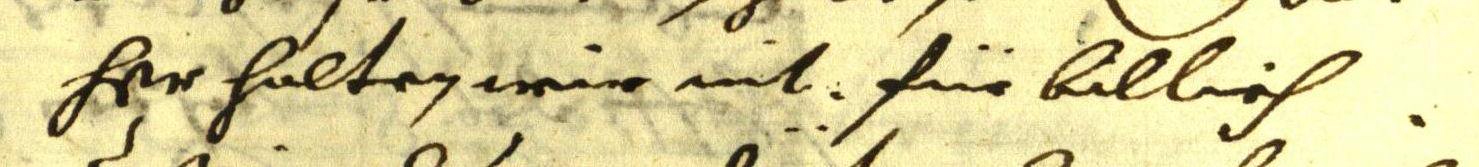her halten wir nit. für billich.
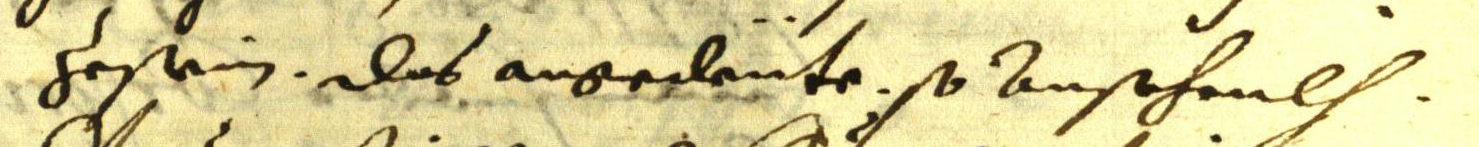Zesein. das angedeüte so Ansehnlich.
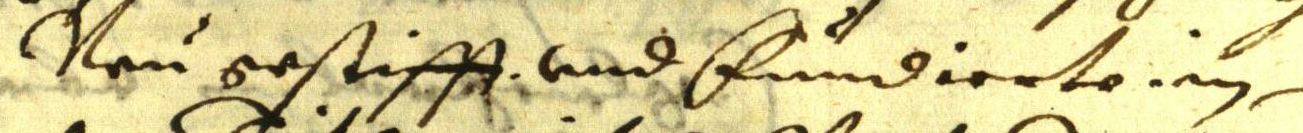Neū gestifft. vnd fūndierte. im
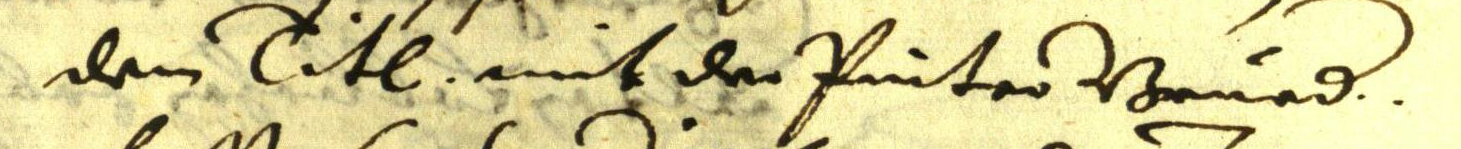dem Titl. mit der Pinter Brūed¬
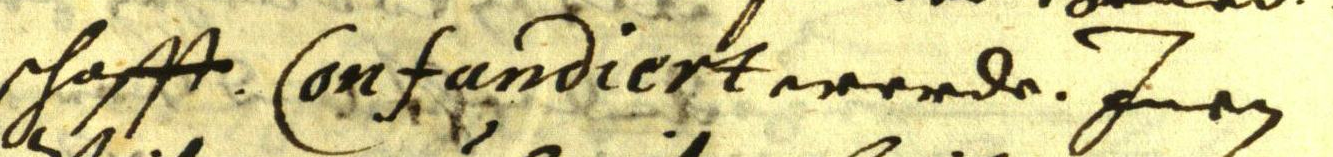schafft Confandiert werde. Inen
